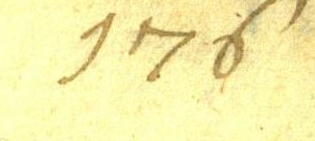176
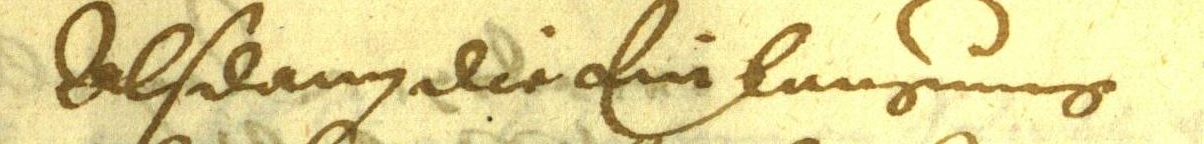Alsdann die Einlangūng
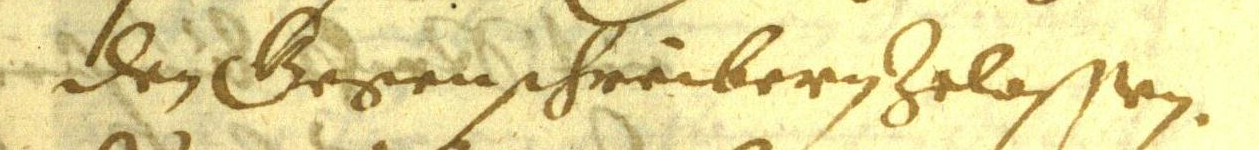den Gegenschreibern Zelassen.
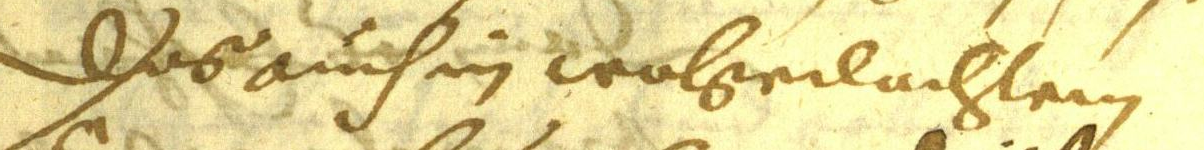Das aūch in wolgedachtem
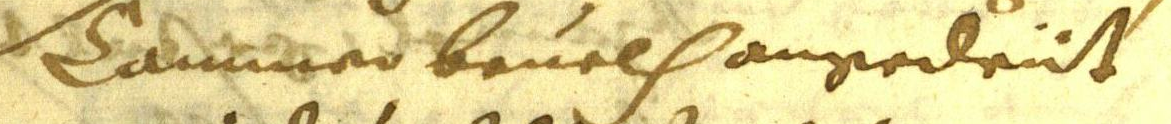Cammer beūelh angedeüt
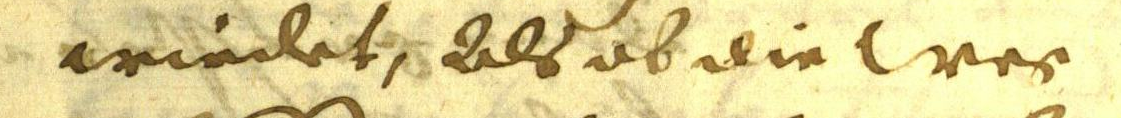wirdet, Als ob die Weg
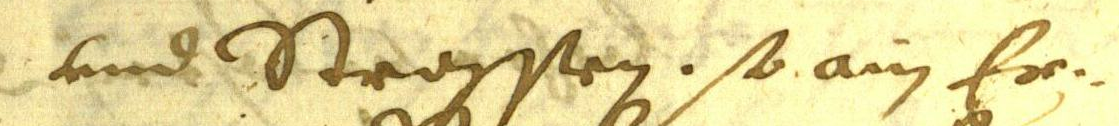vnd Strassen. so ain Er¬
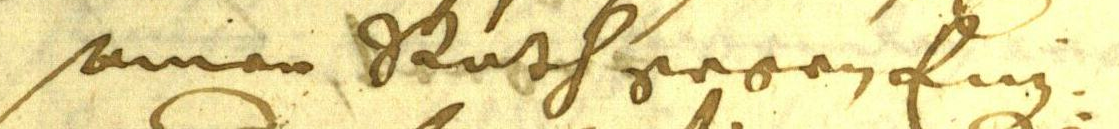samer Rath gegen Ein¬
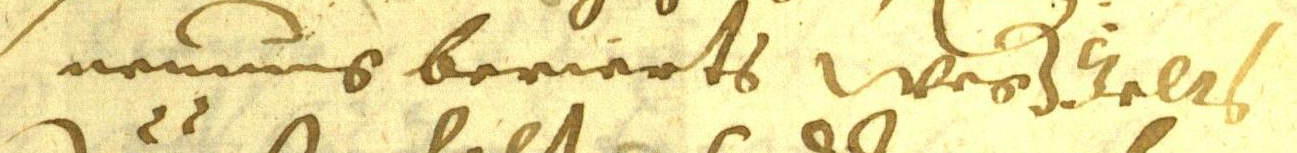nemūng berierts Weg Gelts
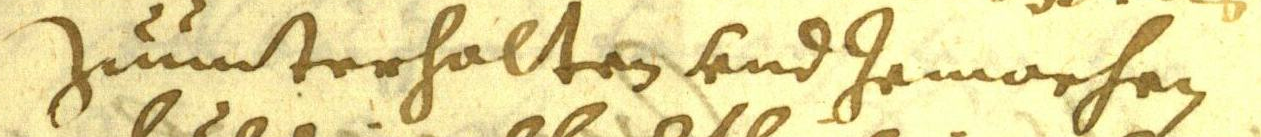Zūūnterhalten vnd Zemachen
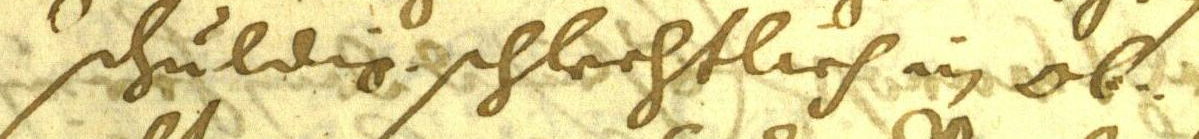schūldig. schlechtlich in ob¬
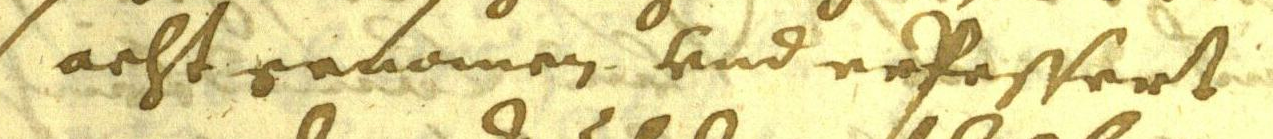acht genomen. vnd erPessert
